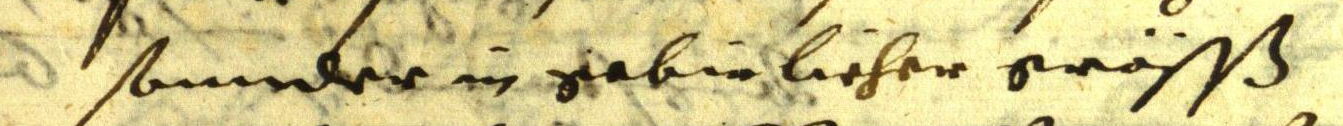sonnder in gebirlicher grösß
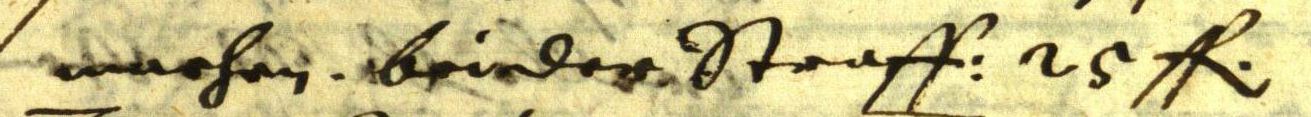machen. beider Straff: 25 fl.
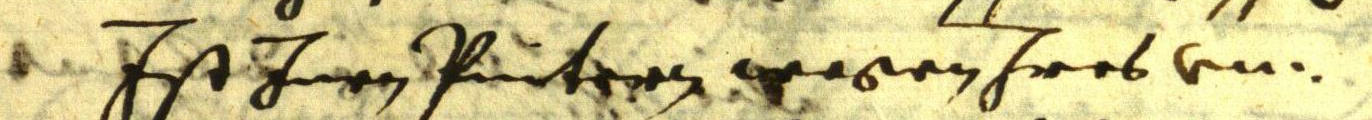Ist Inen Pintern wegen Ihres vn¬
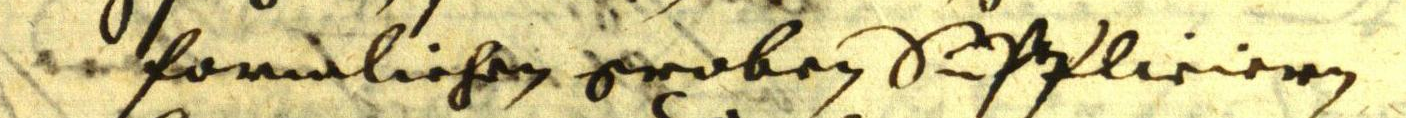formlichen groben SūPPliciern
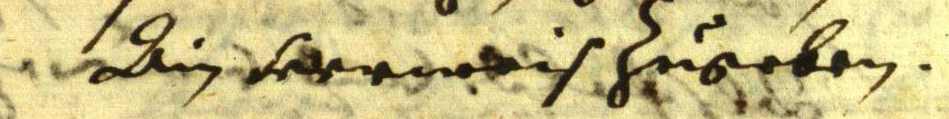Ain verweis Zūgeben.
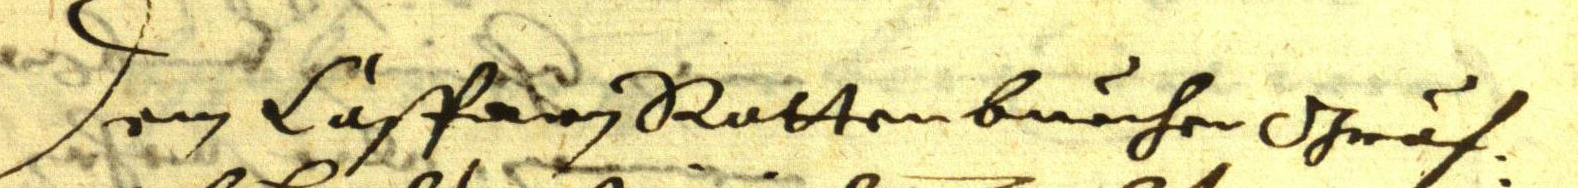Dem Casparn Rottenbūecher Grāf¬
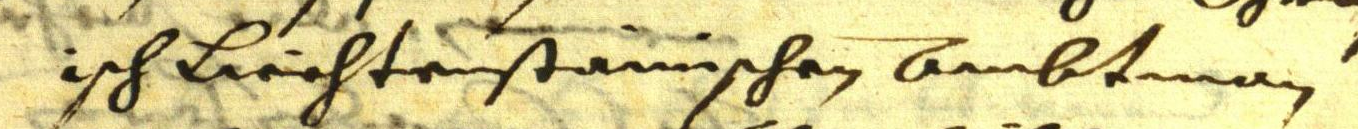isch Liechtenstainischer Ambtman
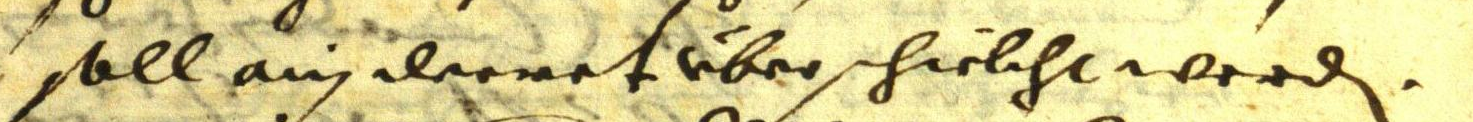soll ain decret v̄ber schickht werd.
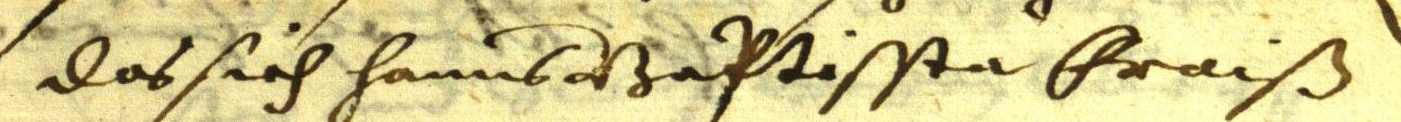das sich Hanns BaPtissta Fraiß
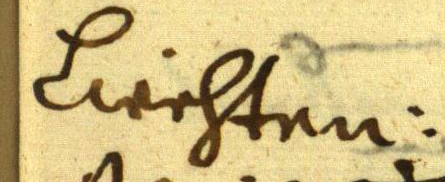Liechten¬
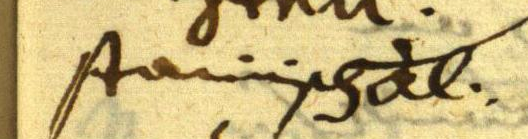stainisch Al¬
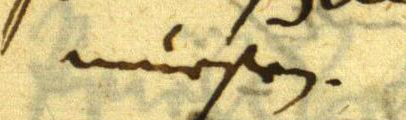mūesen.
